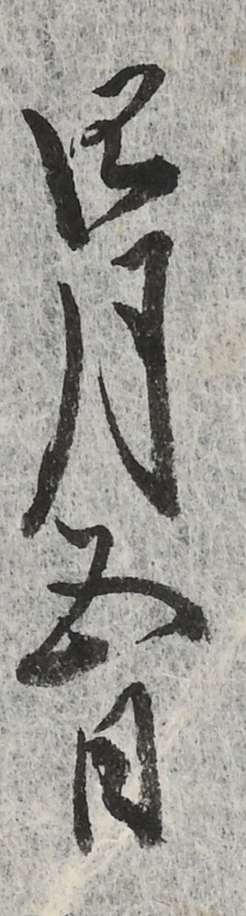四月五日
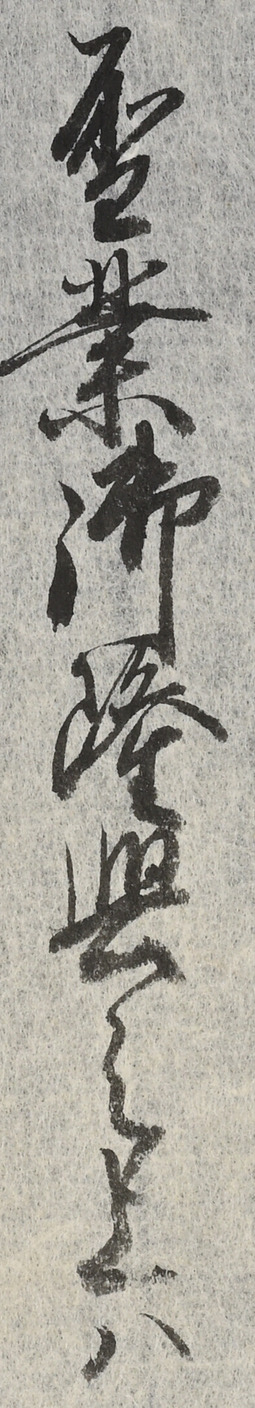聖業御隆興之上ハ
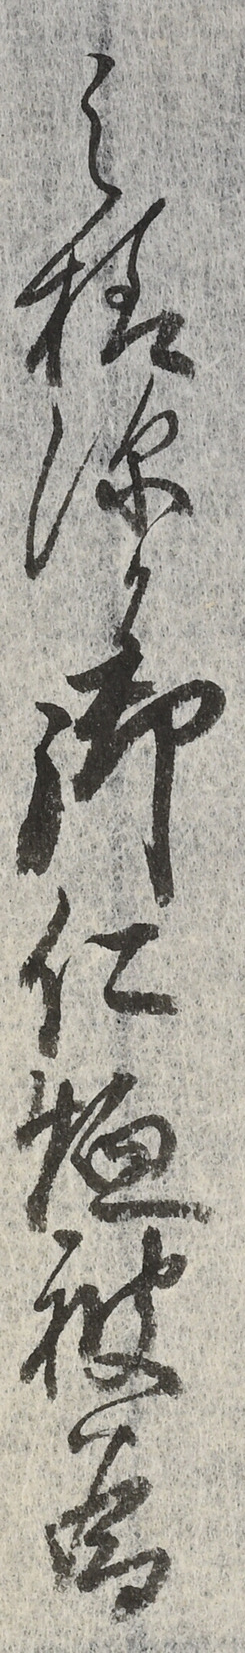之様深ク御仁被為
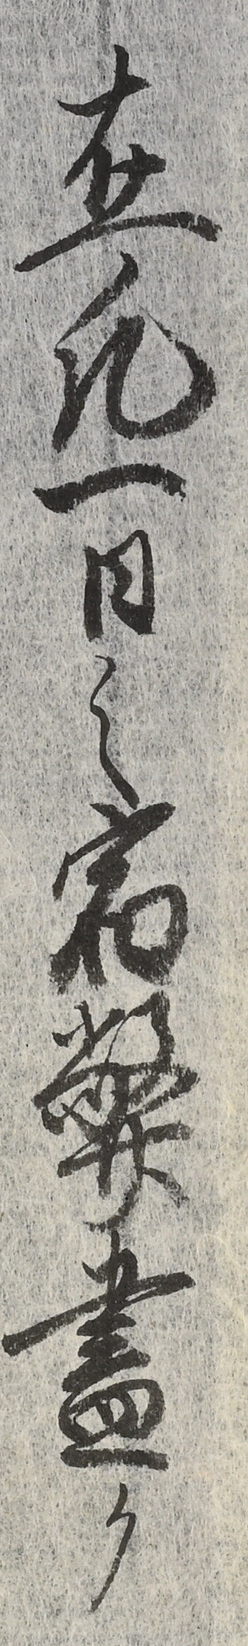在凡一日之宿弊尽ク
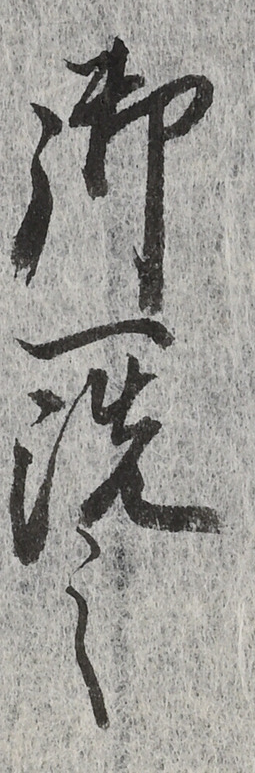御一洗之
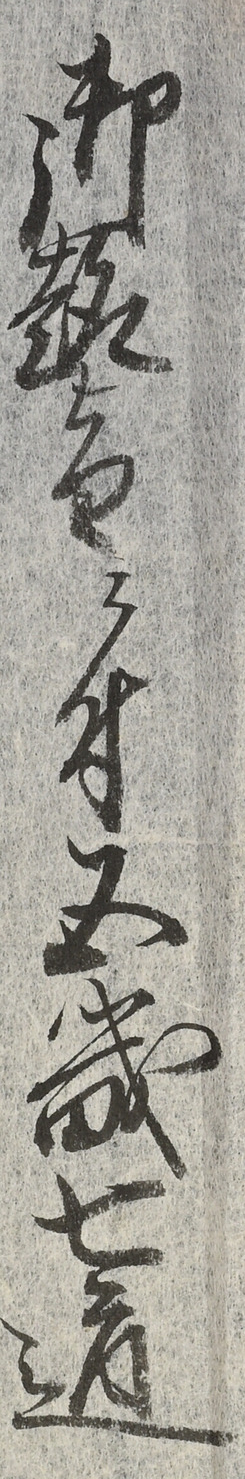御趣旨ニ付五畿七道
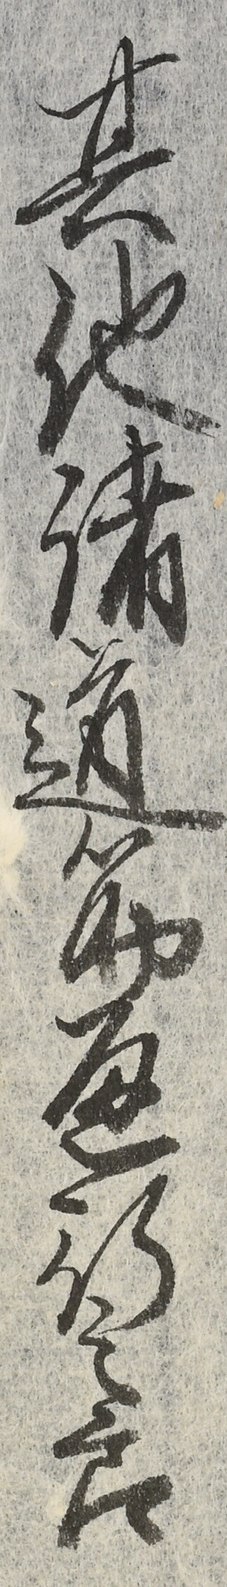其他諸道筋通行之節
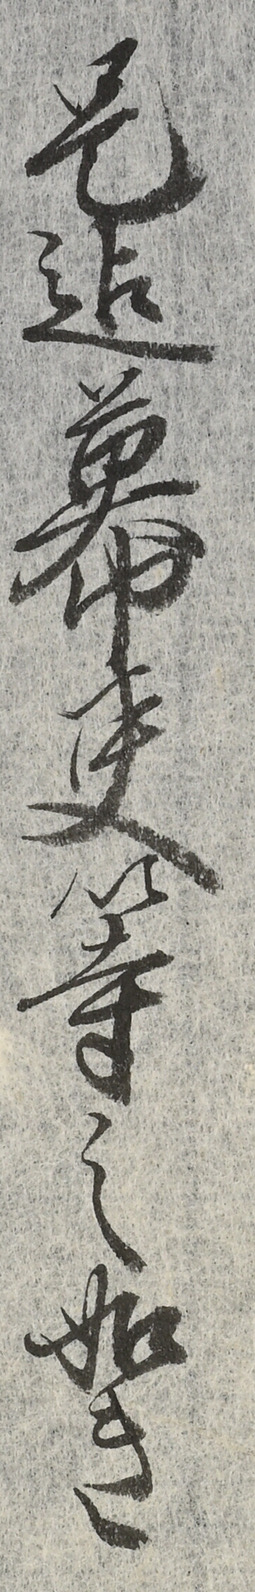是迄幕吏等之如き
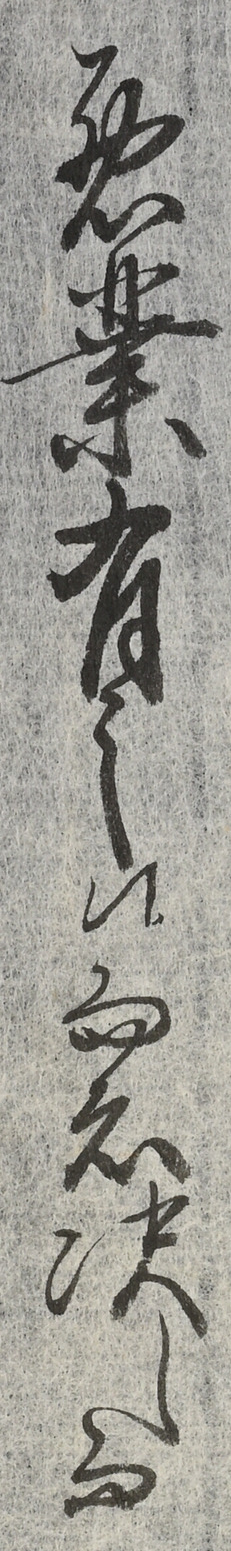悪業有之候而決し而
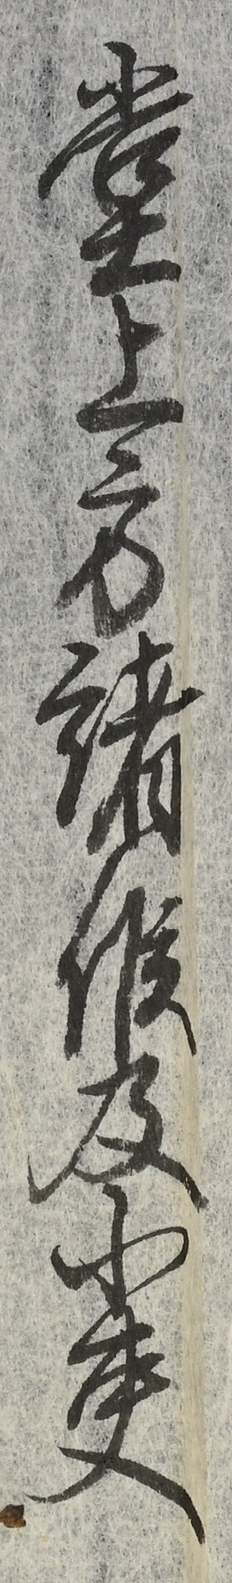堂上方緒候及小吏
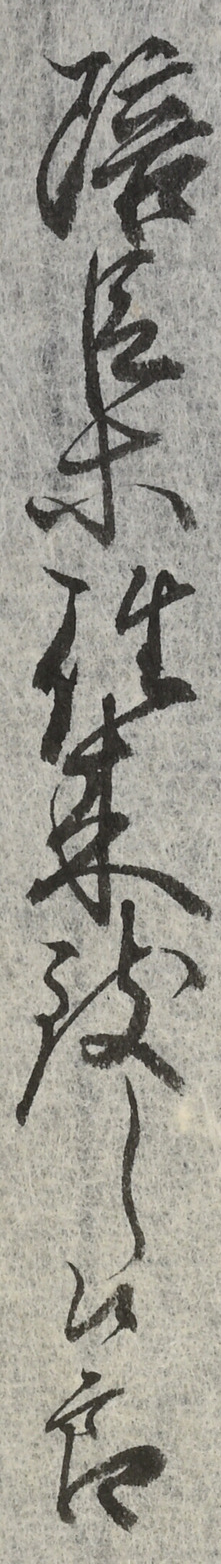陪臣等往来致し候節

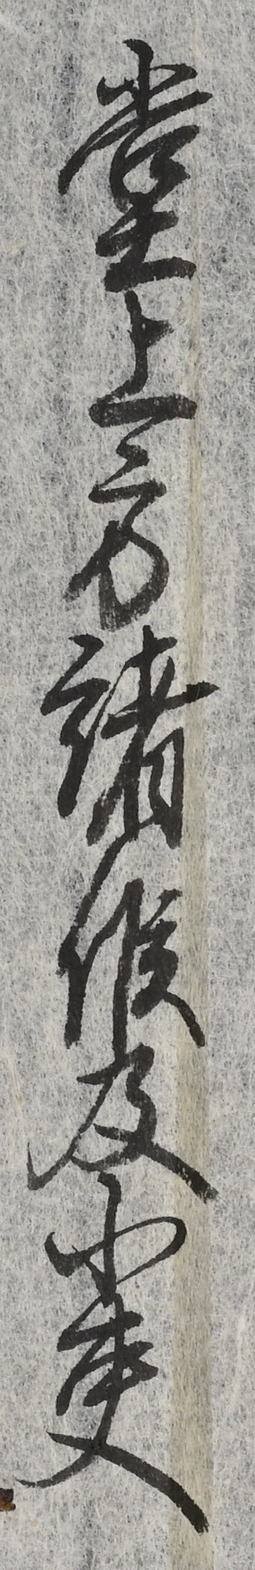堂上方緒候及小吏
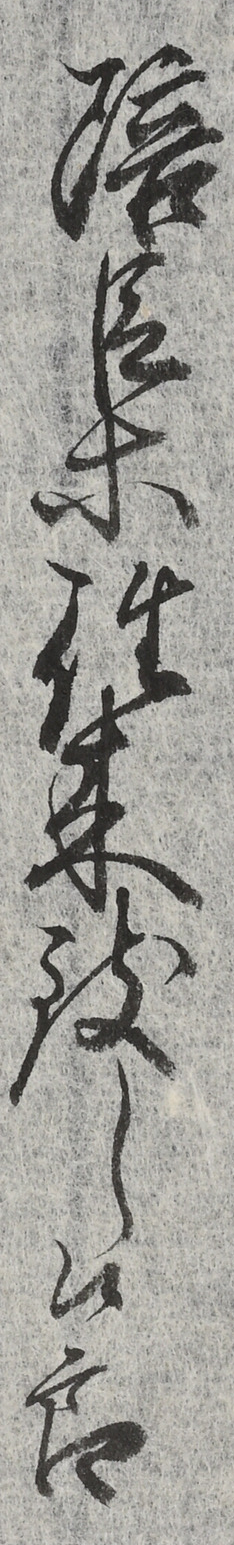陪臣等往来致し候節
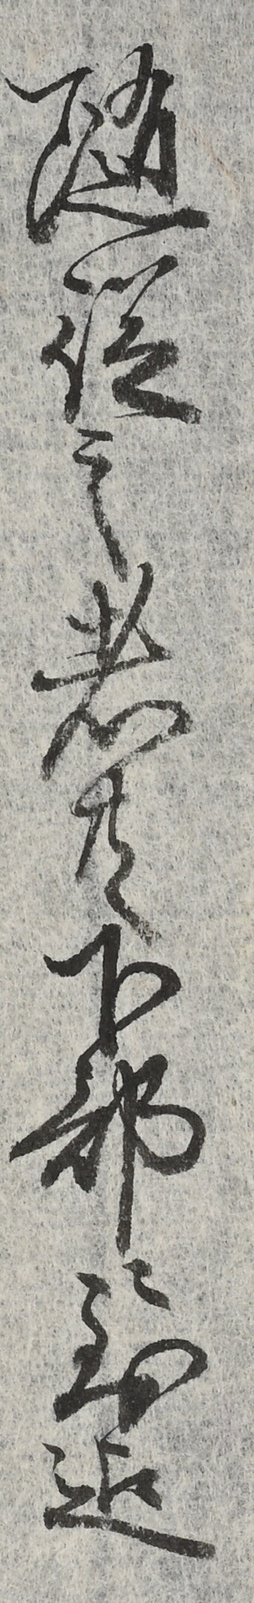随従之者共下部ニ到迄
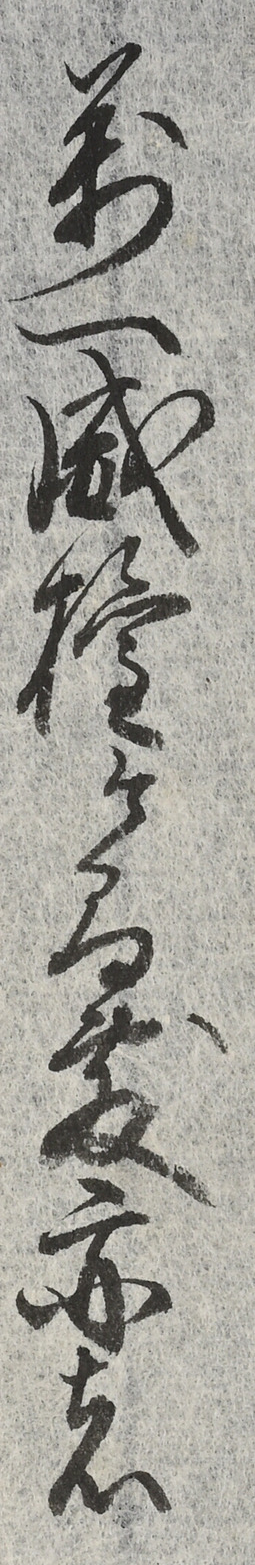万一威権ヶ間敷亦者
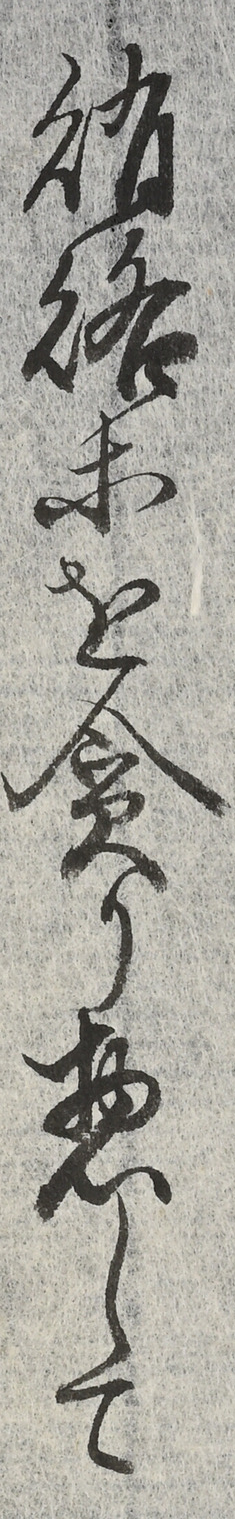賄賂等を貪り惣して
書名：布告（写）
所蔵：伊那市立高遠町図書館・合同会社AMANE
